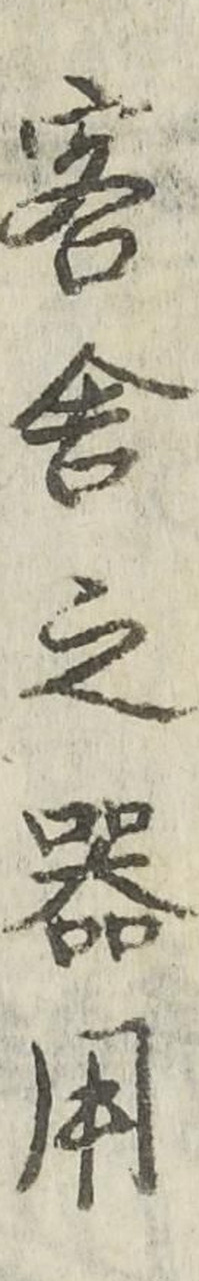客舎之器用
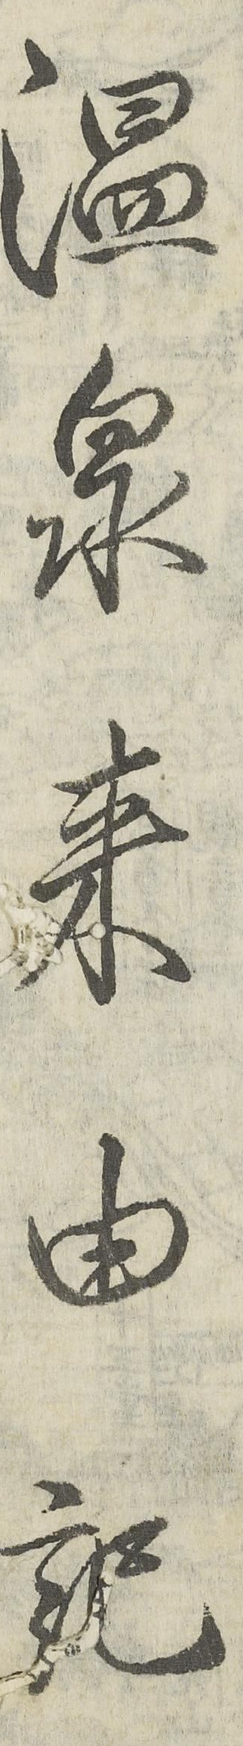温泉来由記
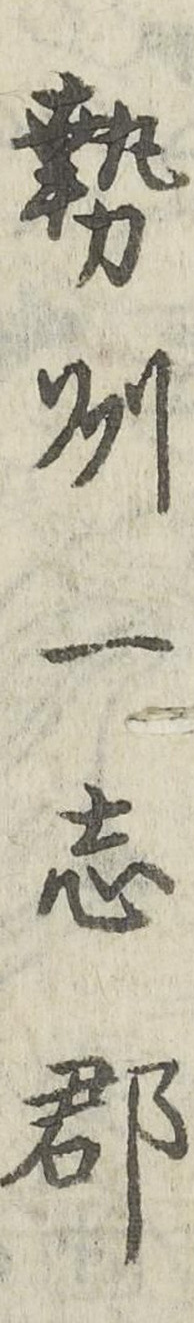勢州一志郡
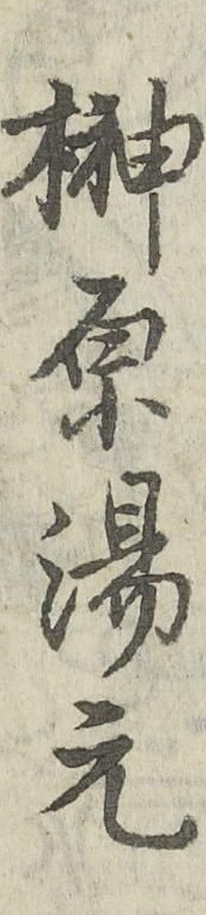榊原湯元

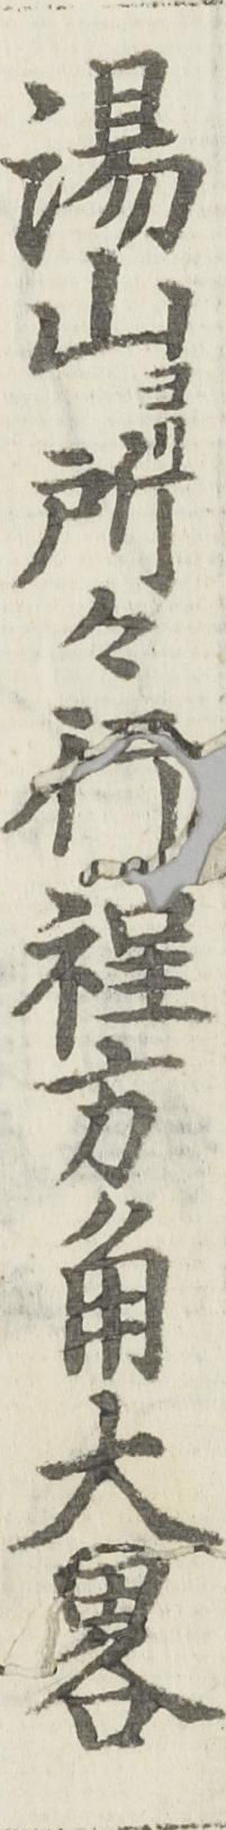湯山ヨリ所々行程方角大略

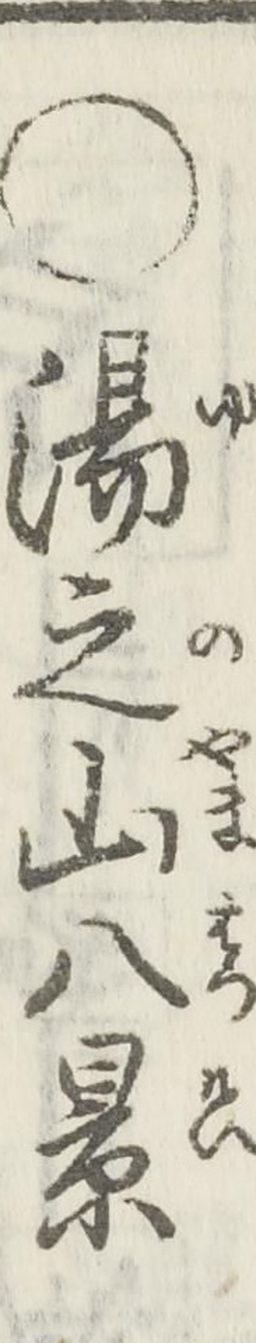〇湯之山八景
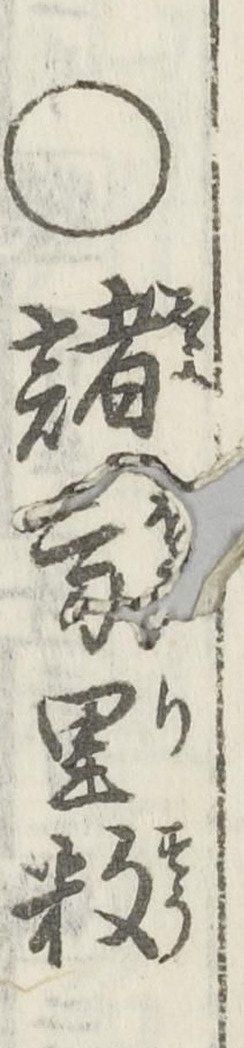〇諸方里数
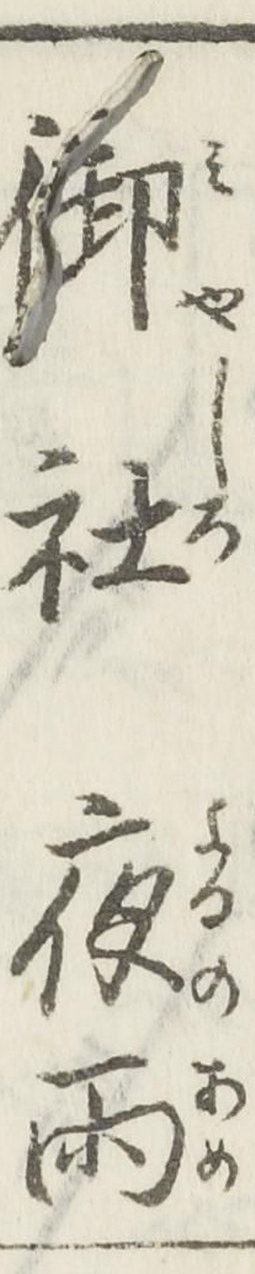御社夜雨
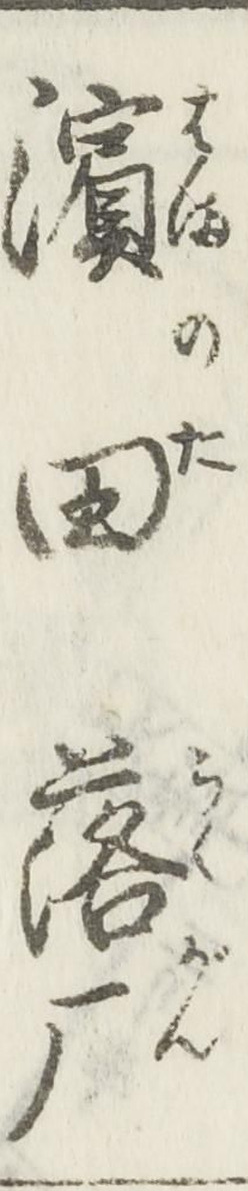浜田落厂
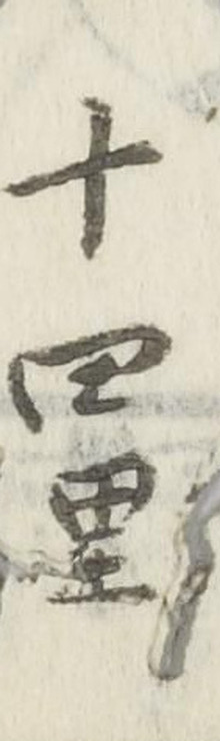津四里
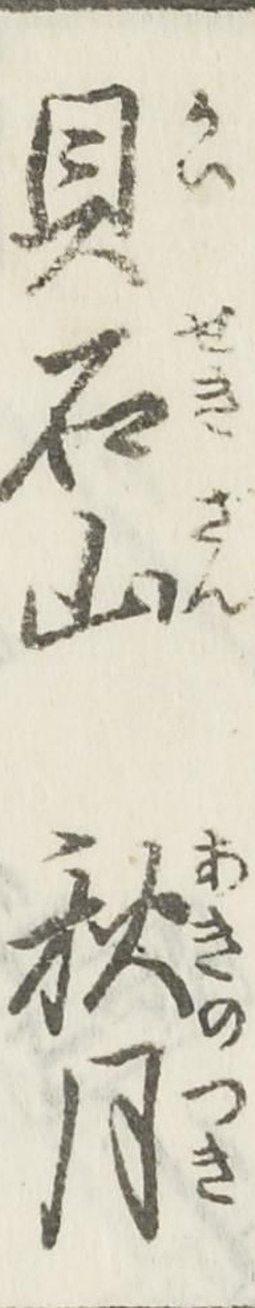貝石山秋月
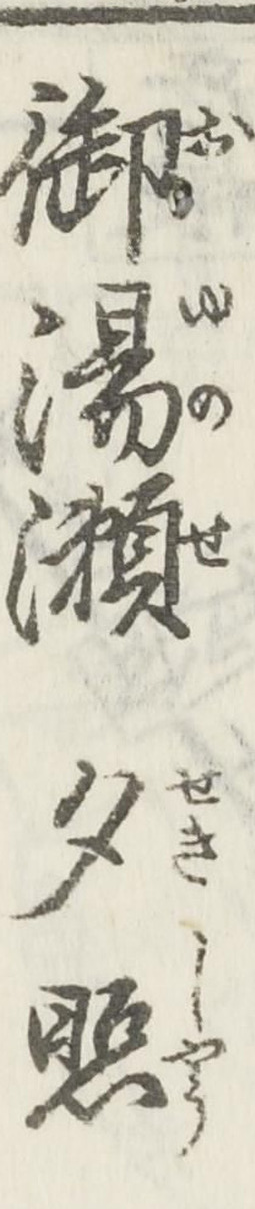御湯瀬夕照
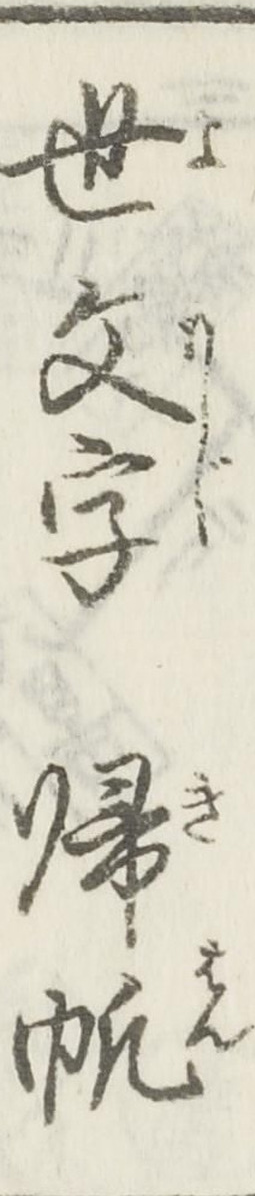世文字帰帆
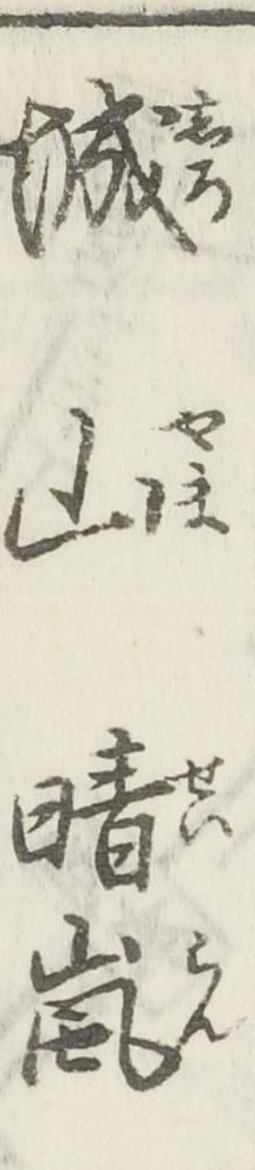城山晴嵐
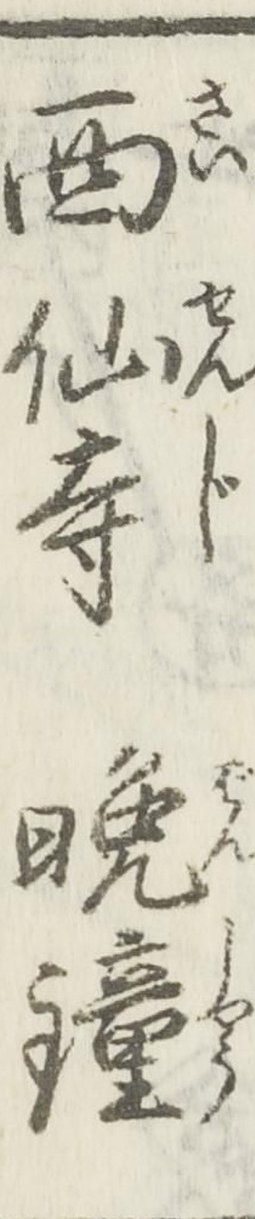西仙寺晩鐘
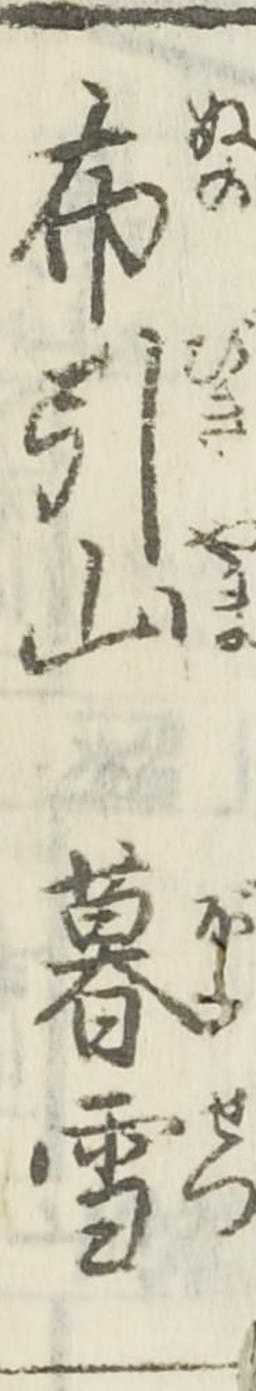布引山暮雪
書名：温泉来由記
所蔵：東京大学地震研究所図書室 Earthquake Research Institute Library, The University of Tokyo, JAPAN
